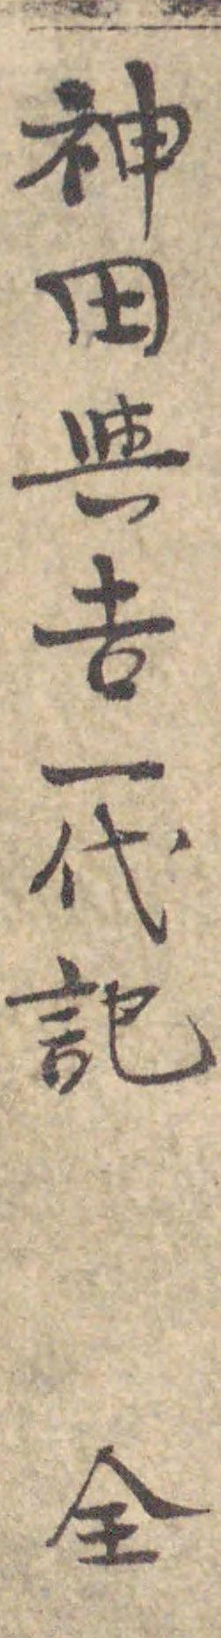神田與吉一代記全
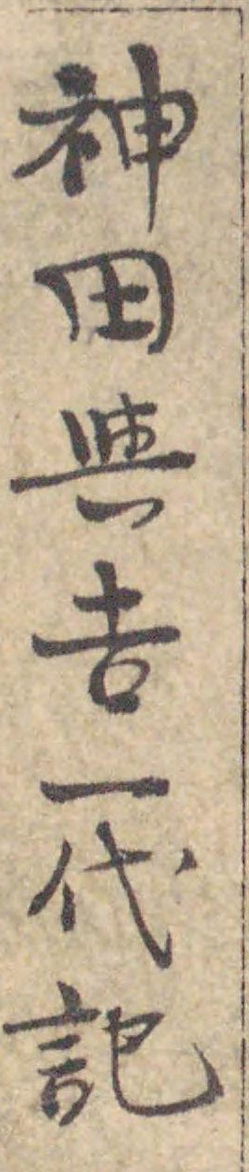神田與吉一代記全

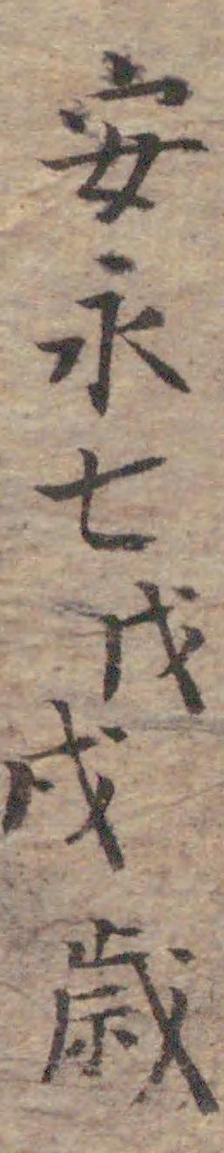安永七年戊戌歳
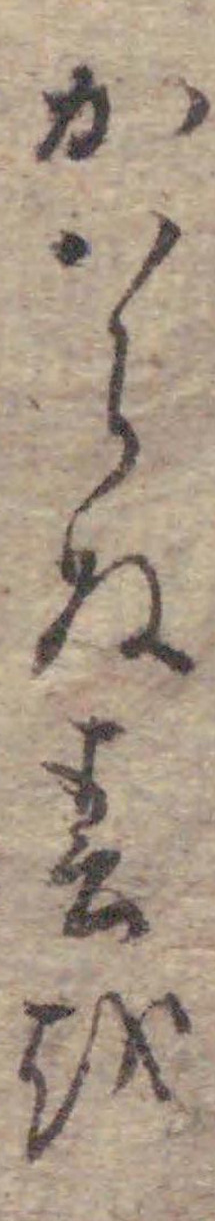かはらぬ春を
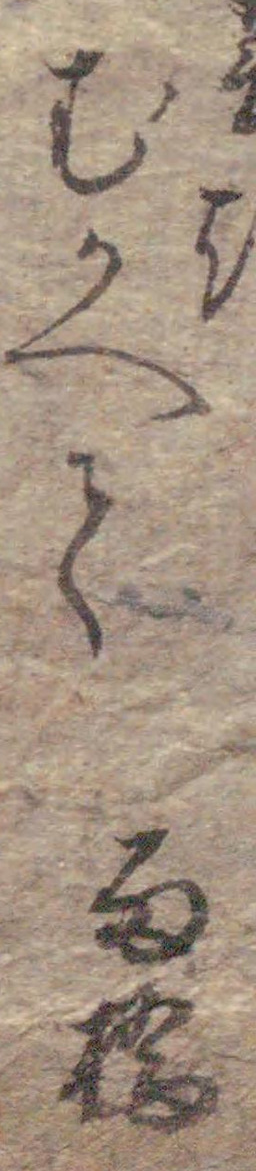むかへて両橋
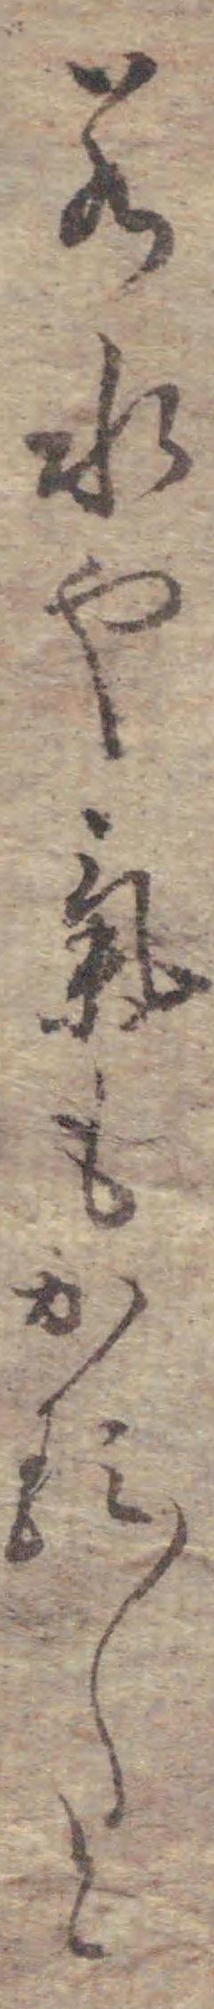若水や気もかる〳〵と
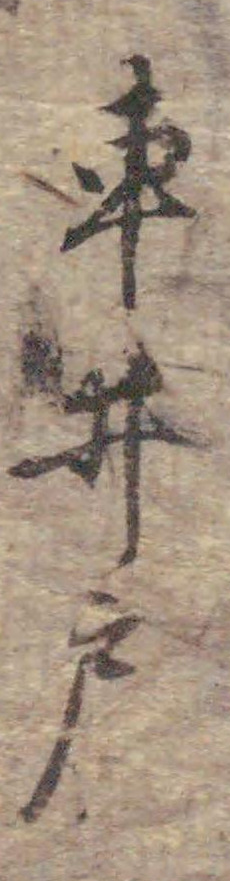車井戸
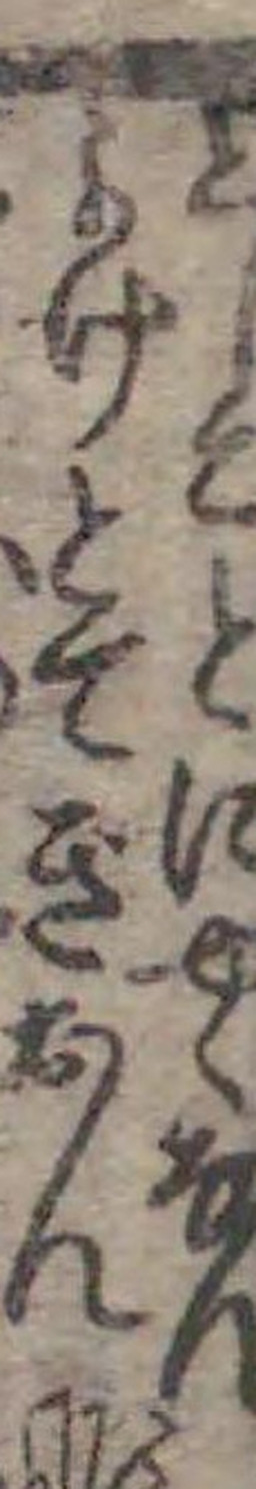よけとてぎおん
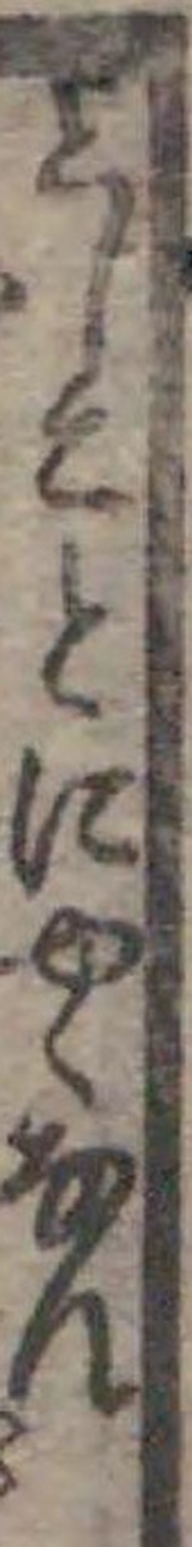としことにやくなん
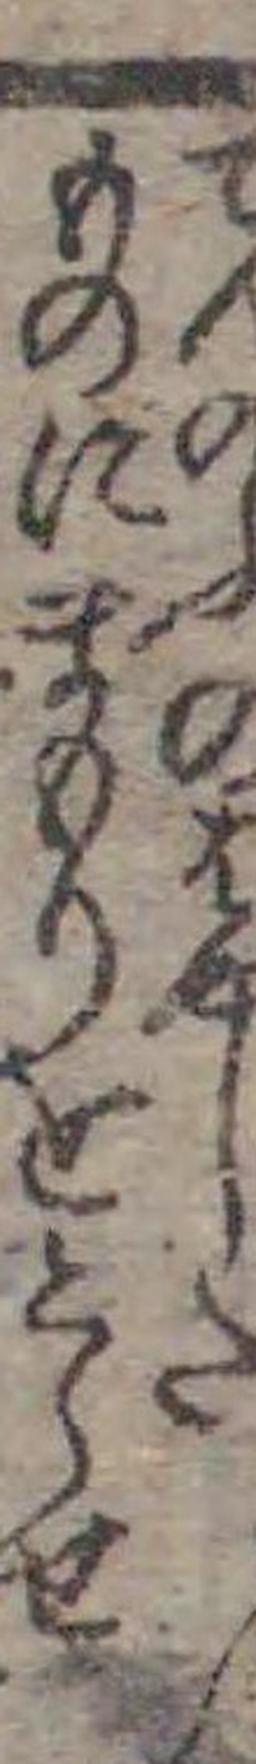ものにまもりをとらせ
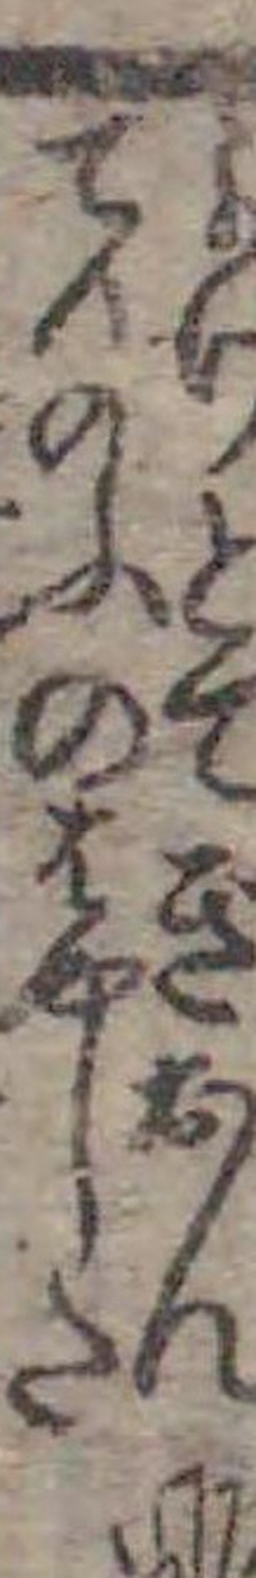てんのふのはやした
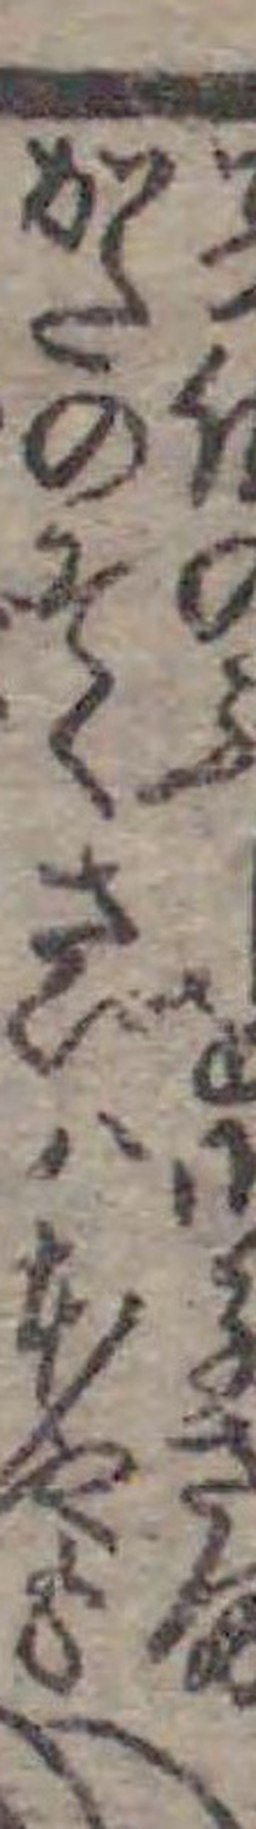がたのそくさひは本やも
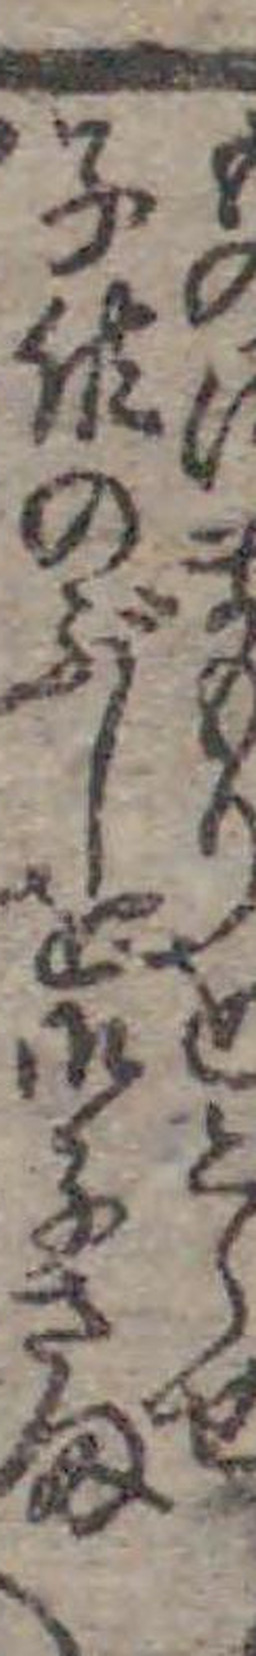子供のぶしを御子さま
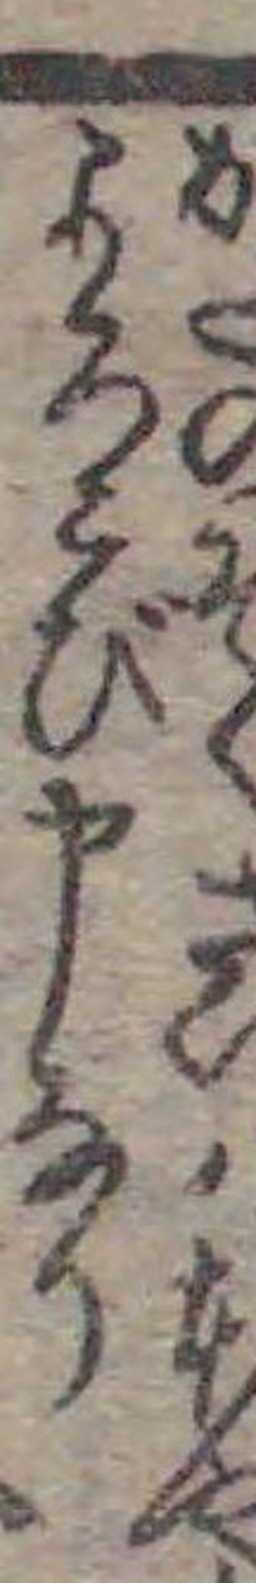よろこび申なり
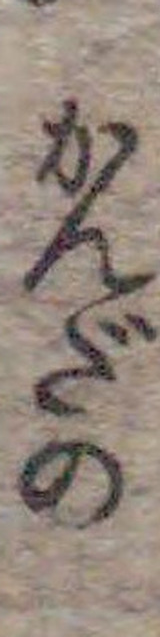かんだの
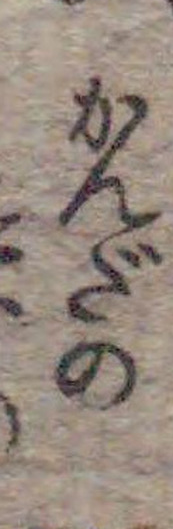かんだの
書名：神田与吉一代記 : 3巻
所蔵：国立国会図書館 National Diet Library, JAPAN
